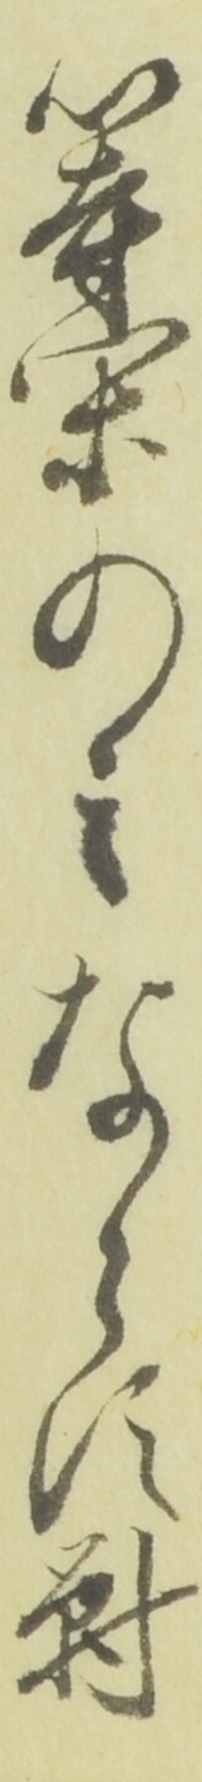等閑のミならす対
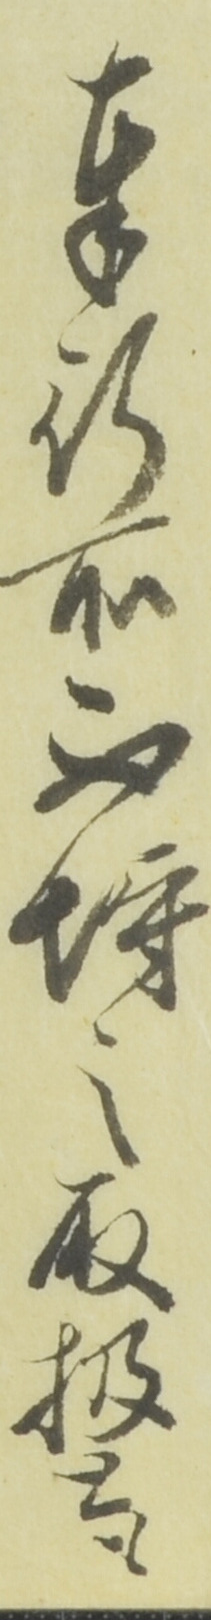奉行所不埒之取扱とも
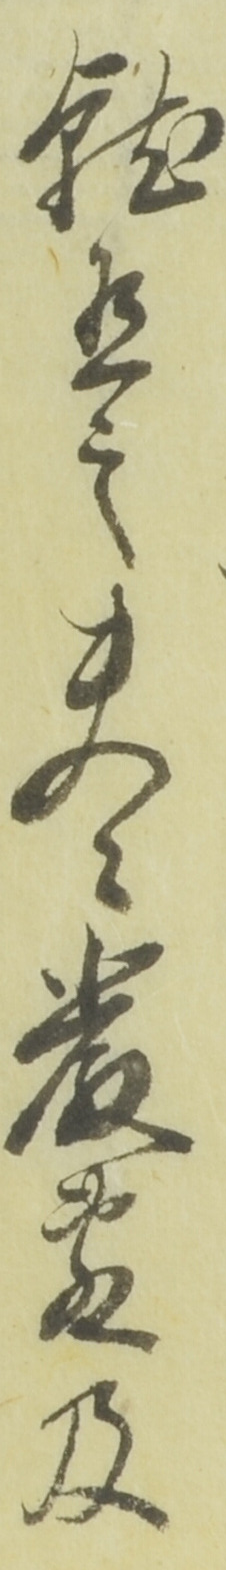就有之夫々厳敷及
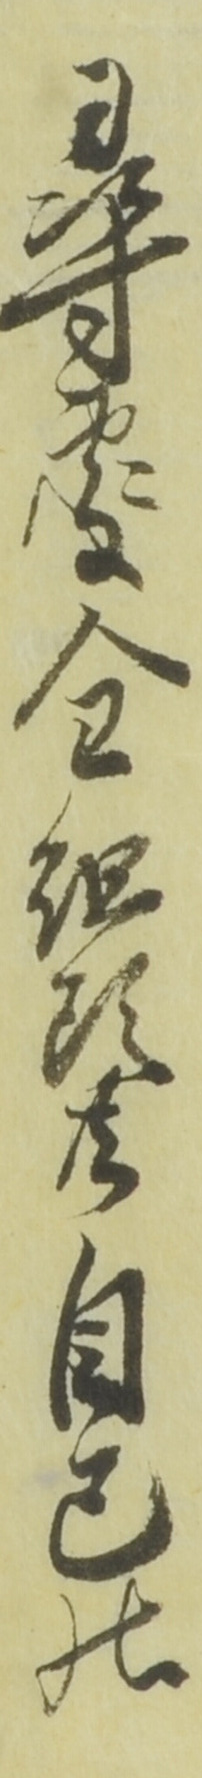尋処全組頭共自己の
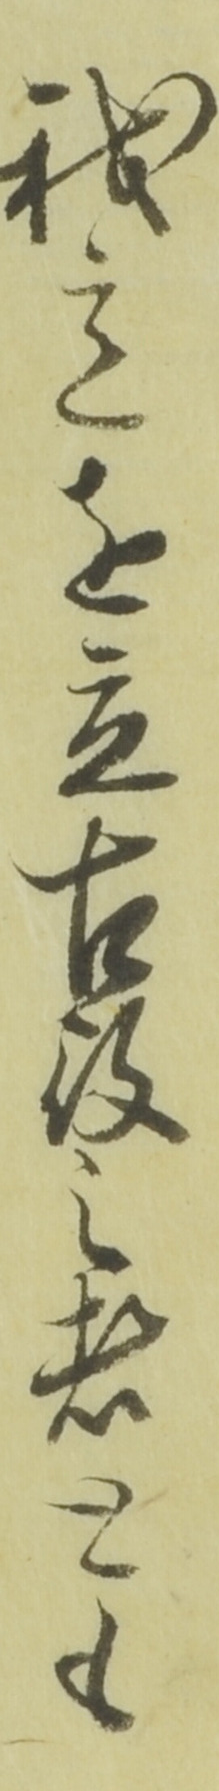我意を立古役之者とも
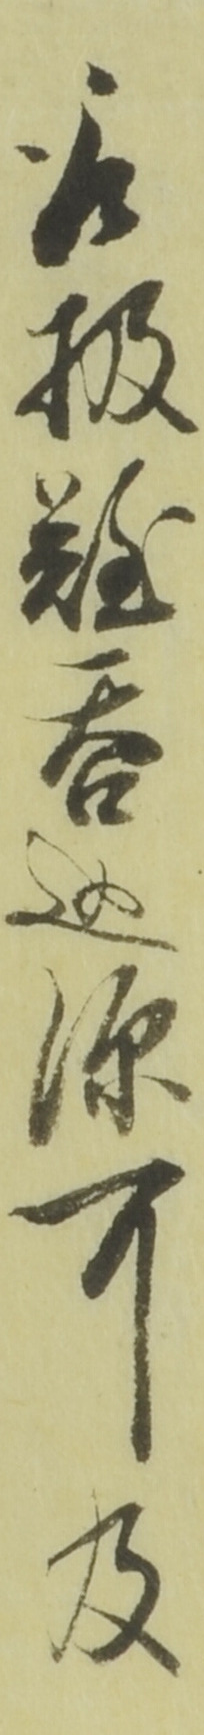取扱難呑込深可及
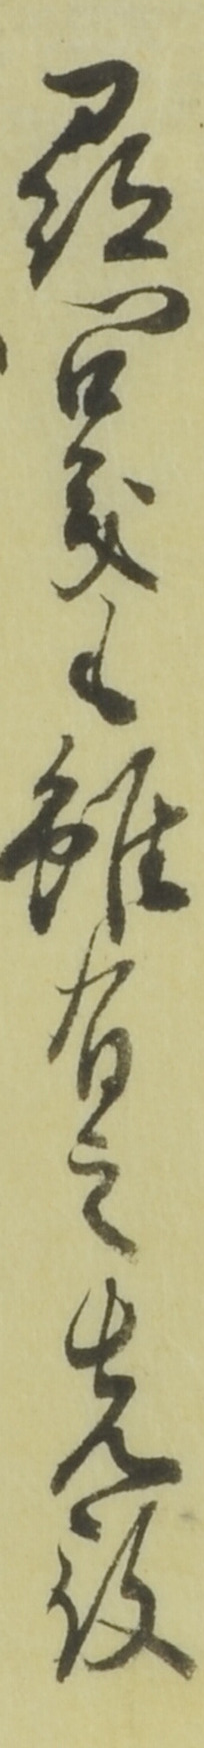尋問義も難有之先役
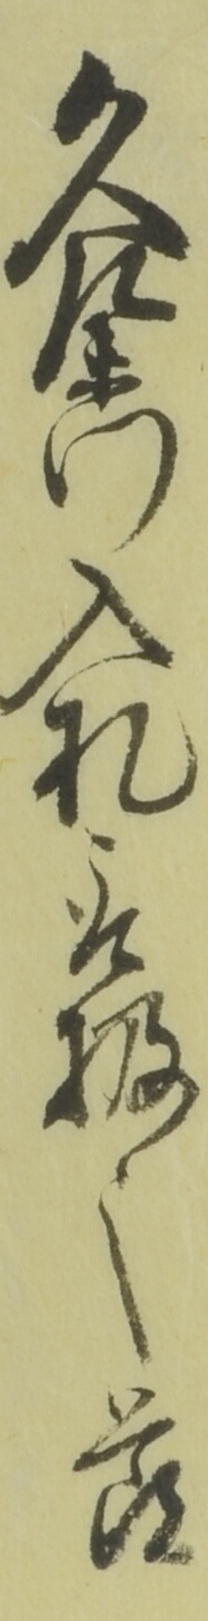久左衛門入札取扱之節
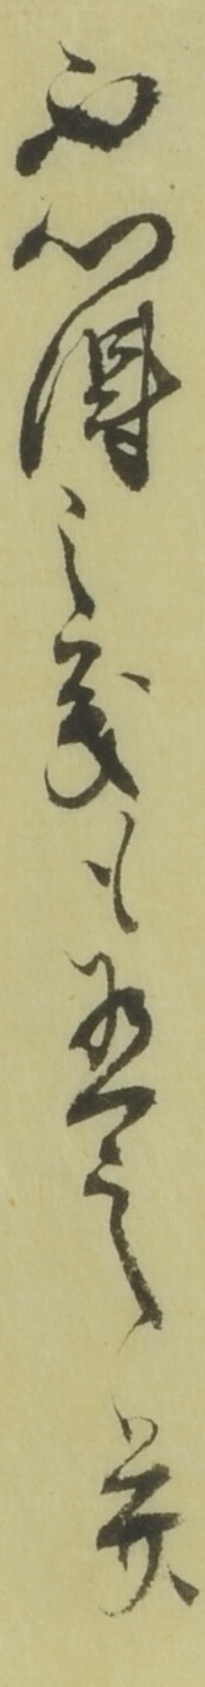不心得之義も有之并
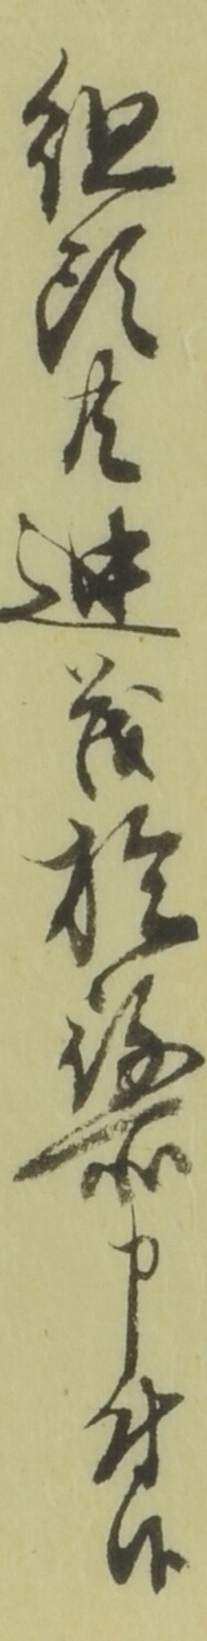組頭共迚も於役所申付候
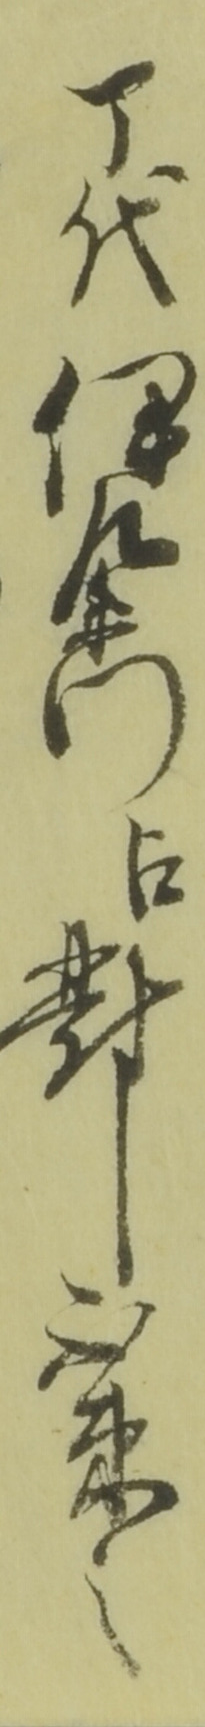丁代伊左衛門江対し不束之
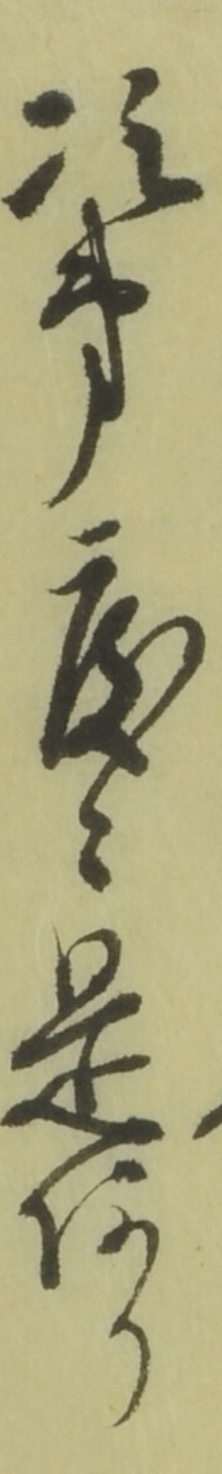次第度々是あり
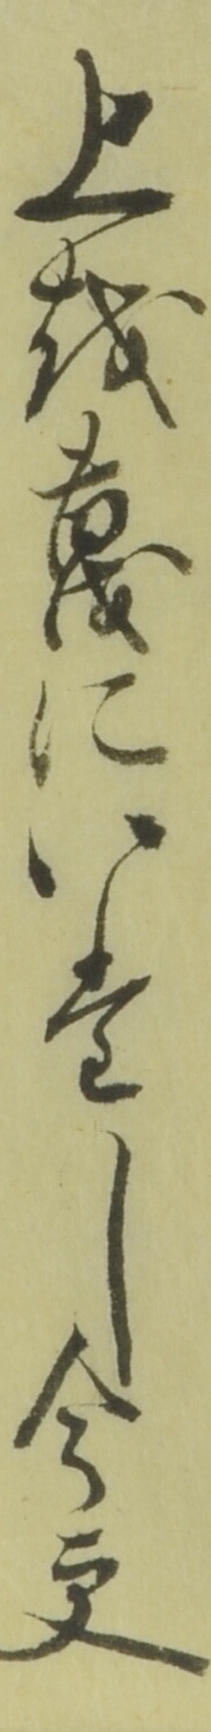上を蔑にいたし今更

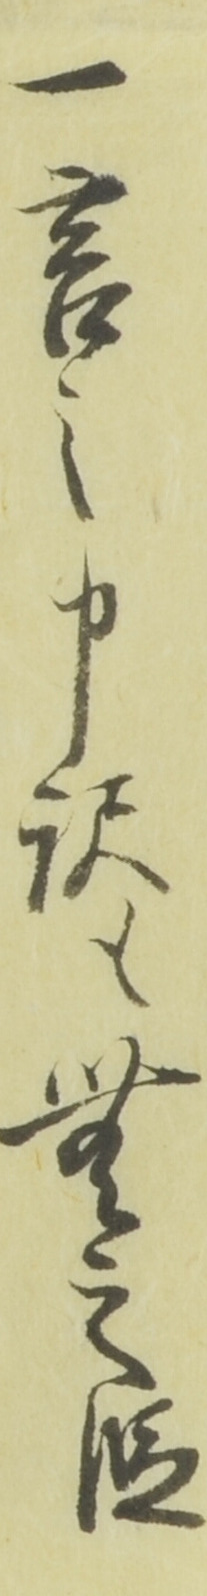一言之申訳も無之段
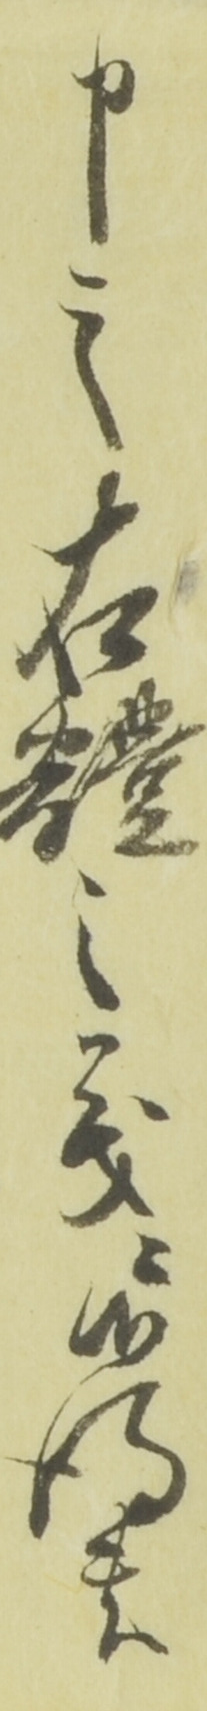申之右体之義ニ候得共
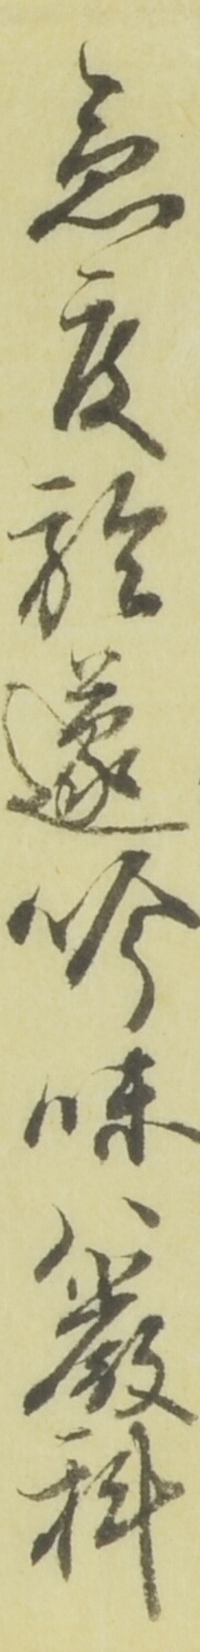急度於遂吟味ハ厳科
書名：御触書御書附控
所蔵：伊那市立高遠町図書館・合同会社AMANE
